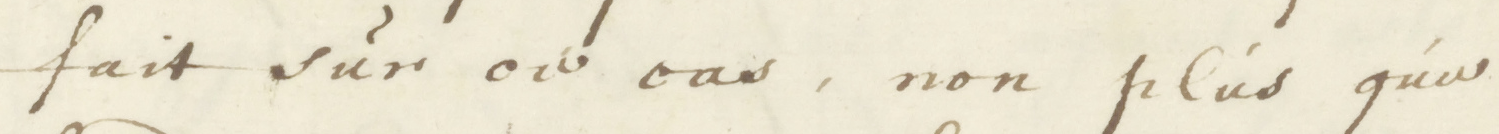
fait sur ce cas, non plus que
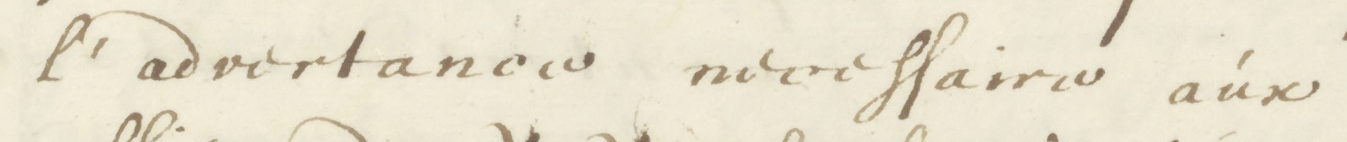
l‛ advertance necessaire aux
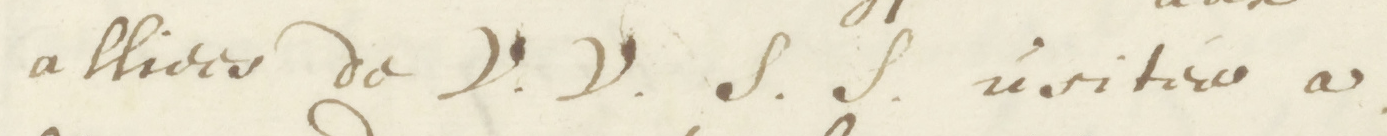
alliees de V. V. S. S. usitee a
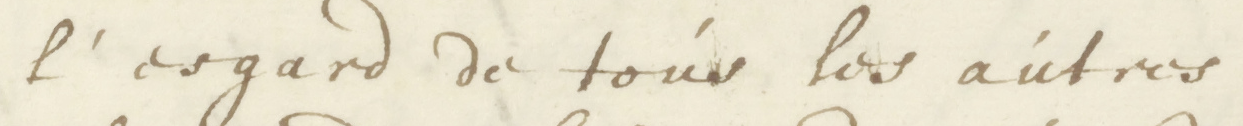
l‛ esgard de tous les autres
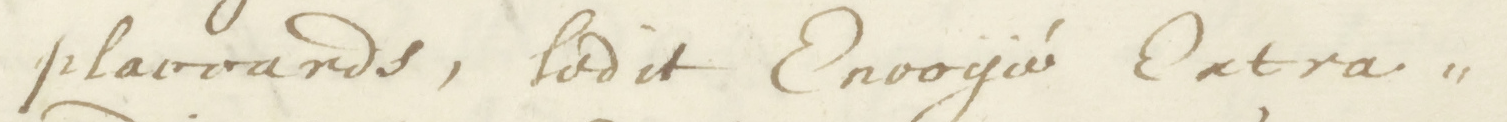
placcards, ledit Envoijé Extra„
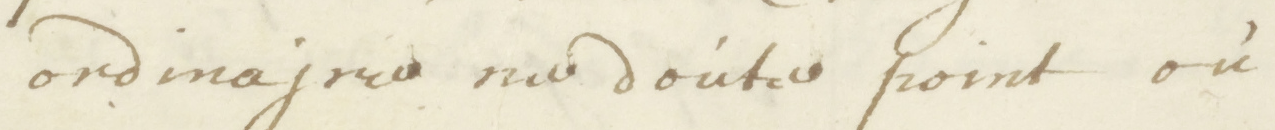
ordinaire ne doute point ou
